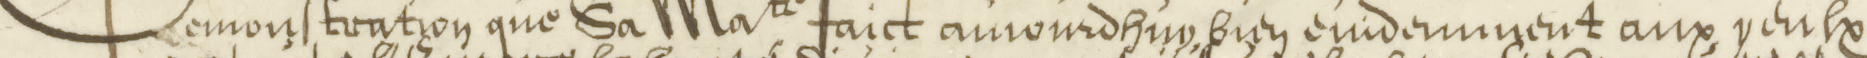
Demonstration que Sa Mate. faict auiourdhuy bien euidemment aux yeulx
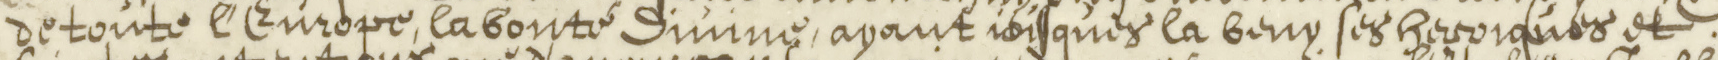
de toute l‛Europe, la bonté Diuine, ayant ioisques la beny ses heroiques et
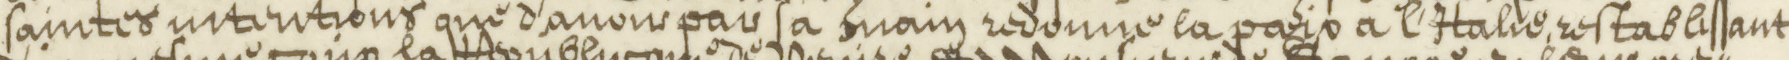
saintes intentions que d‛auoir par sa main redonne la paix a l‛Italie, restablissant
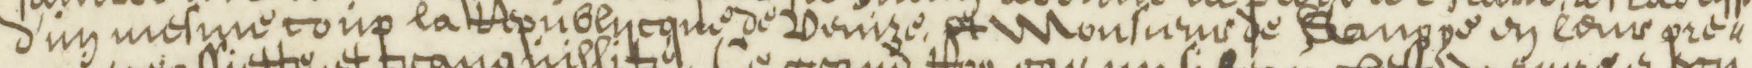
d‛un mesme coup la Republycque de Venize, et Monsieur de Sauoye en leur pre,,
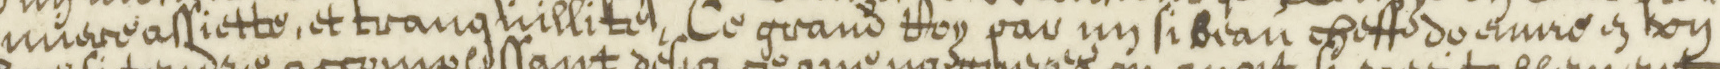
miere assiete, et tranquillité, Ce grand Roy par un si beau cheffe de euure en vn
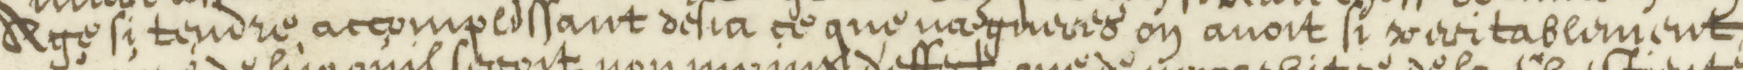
Age si tendre accomplissant desia ce que nagueres on auoit si veritablement
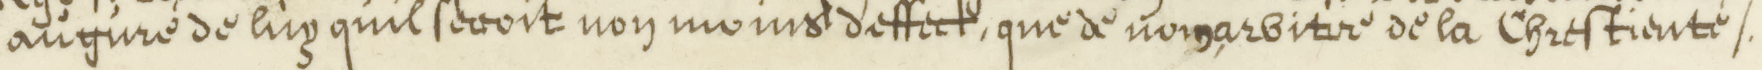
auguré de luy quil feroit non moins d‛effect, que de non arbitre de la Chrestienté
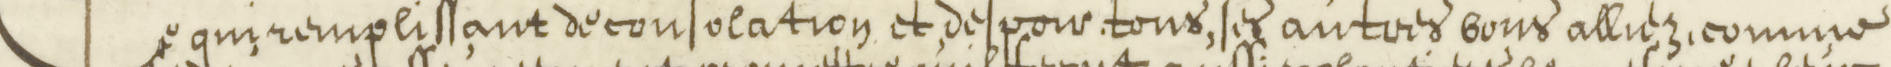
Ce qui remplissant de consolation, et despoir tous ses autres bons alliez, comme
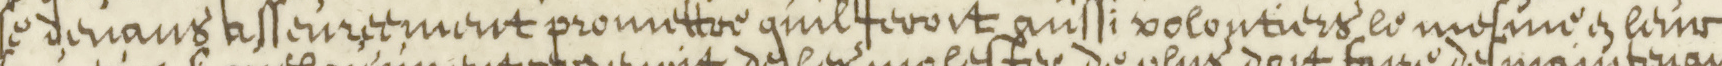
se deuans asseureement promettre quil feroit aussi volontiers le mesme en leur
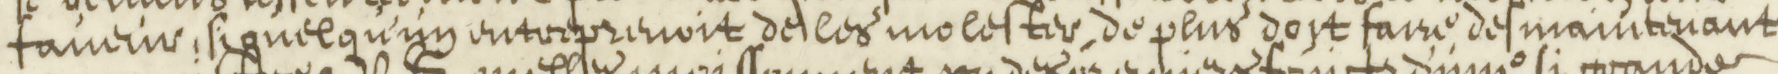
faueur, si quelqu‛un entreprenoit de les molester, de plus doyt faire des maintenant
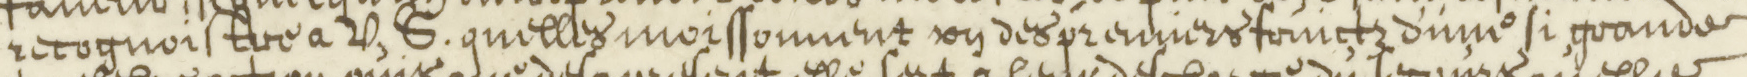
recognoistre a V.S. quelles moissonnent vn des premiers fruictz d‛une si grande
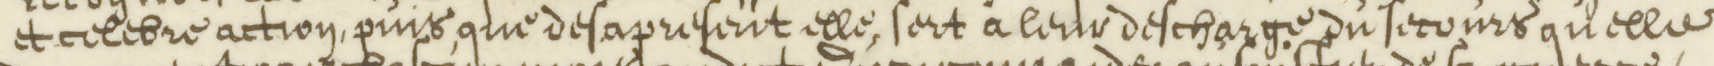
et celebre action, puis que des a present elle sert a leur descharge du secours quelles
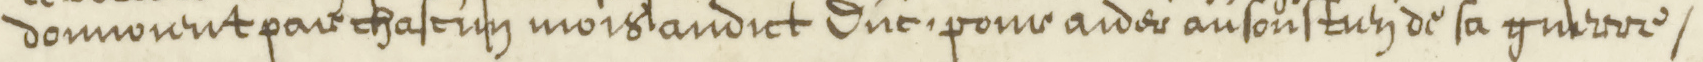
donnoient par chascun mois audict Duc, pour aider au soustien de sa guerre.
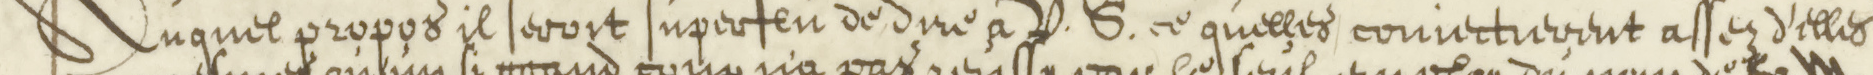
Auquel propos il seroit superflu de dire a V.S. ce quelles coniectierent assez d‛elles
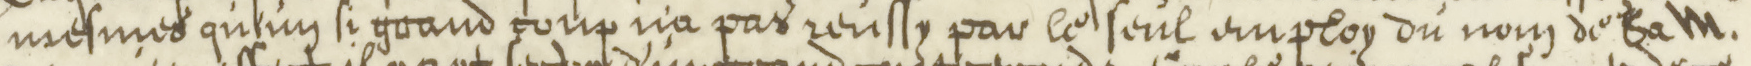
mesmes qu‛un si grand coup na pas reussy par le seul employ du nom de Sa M.
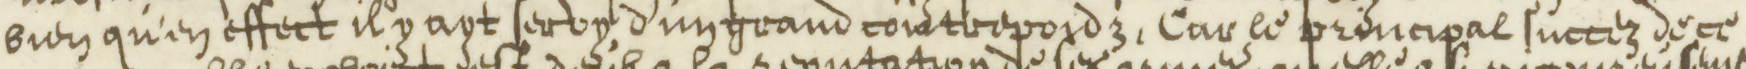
bien qu‛en effect il y ayt servy d'un grand contrepoidz, Car le principal succez de ce
